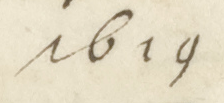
1619
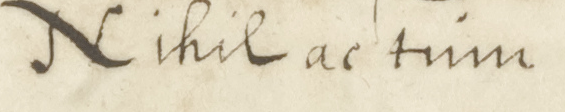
Nihil actum
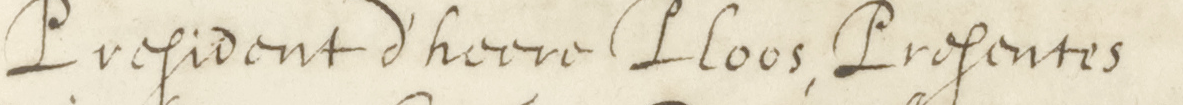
President d'heere Ploos, Presentes
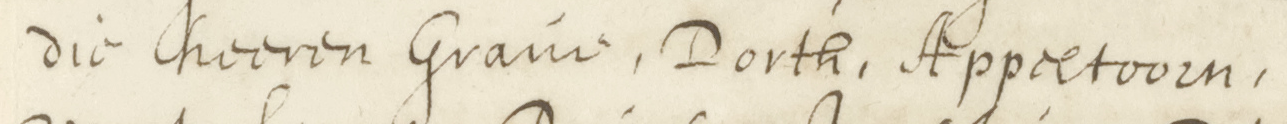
die heeren Graue, Dorth, Appeltoorn,
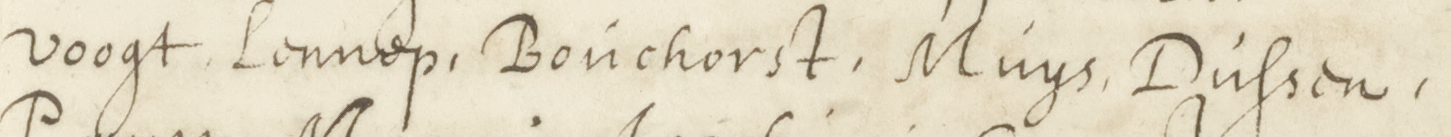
voogt Lennep, Bouchorst, Muys, Dussen,
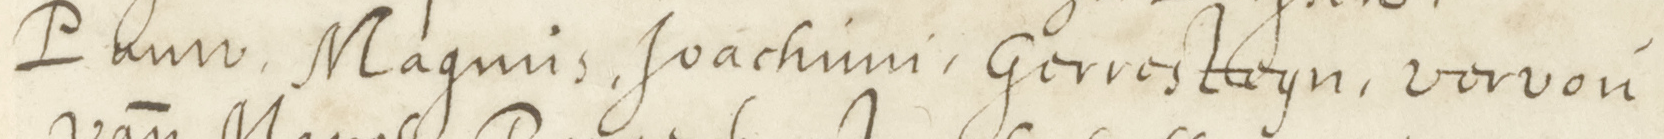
Pauw, Magnus Joachimi, Gerresteyn, vervou
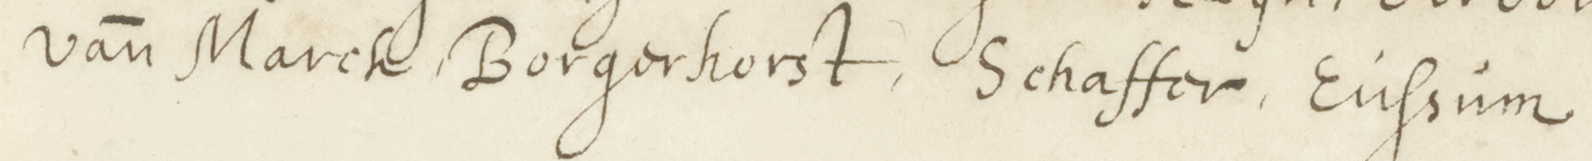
van Marck, Borgerhorst, Schaffer, Eussum
